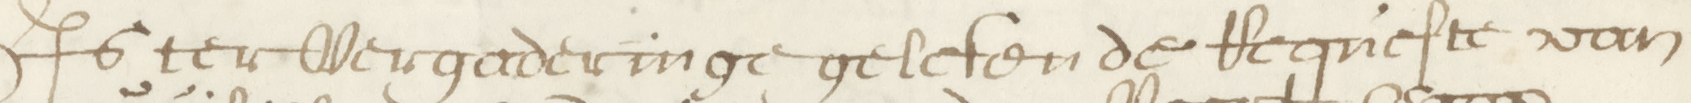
Is ter Vergaderinge gelesen de Requeste van
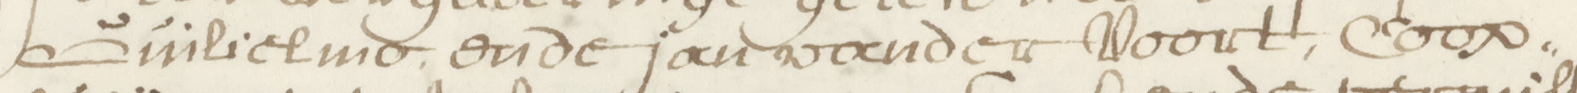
Guilielmo, ende jan vander Voort, Coop,,
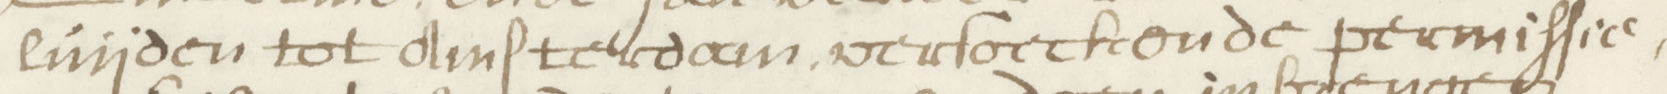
luijden tot Amsterdam, versoeckende permissie,
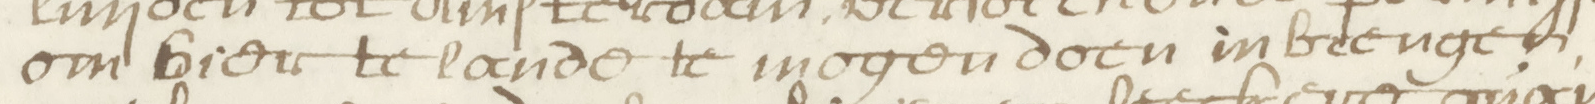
om hier te lande te mogen doen inbrengen,
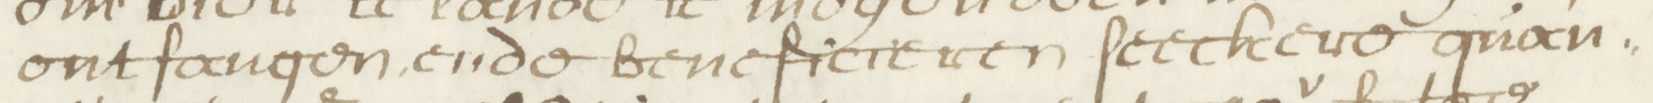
ontfangen, ende beneficieren seeckere quan,,
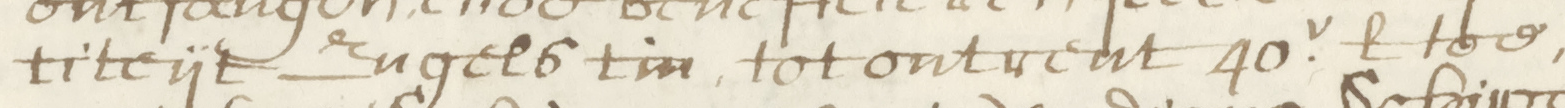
titeijt Engels tin, tot ontrent 40v. L. toe,
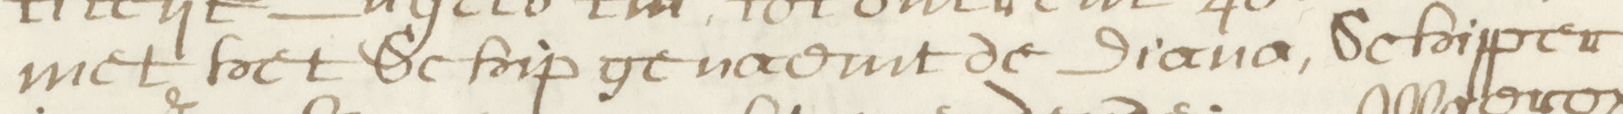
met het Schip genaemt de Diana, Schipper
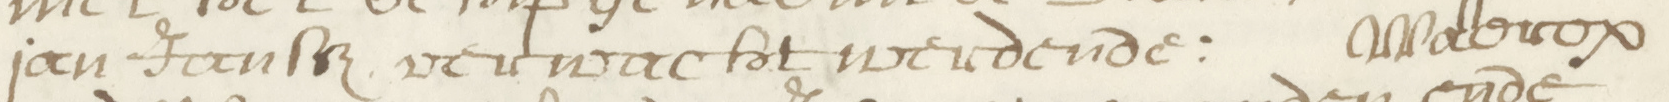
jan Jansz. verwacht werdende: Waerop
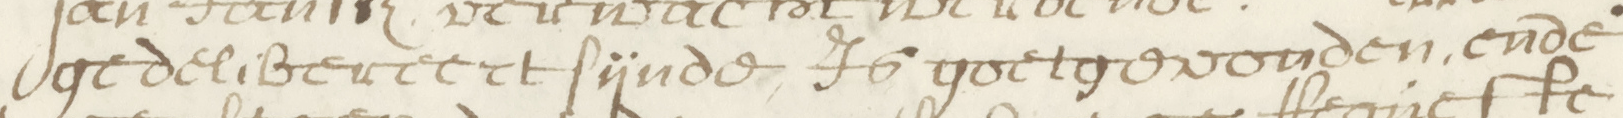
gedelibereert sijnde, Is goetgevonden, ende
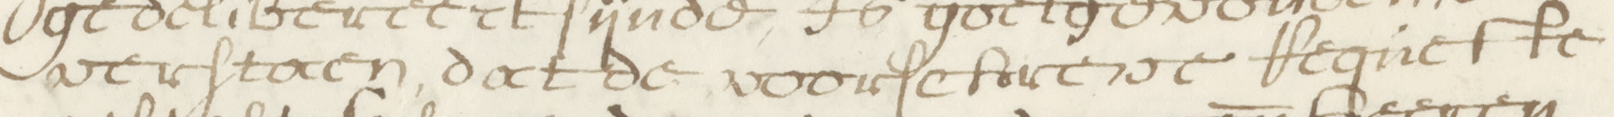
verstaen, dat de voorschreve Requeste
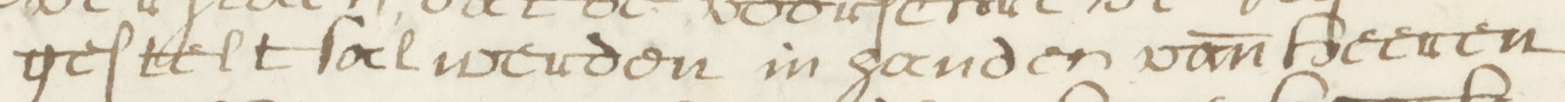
gestelt sal werden in handen van heeren
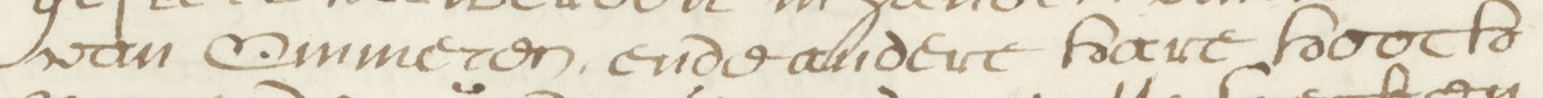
van Ommeren, ende andere hare hooch
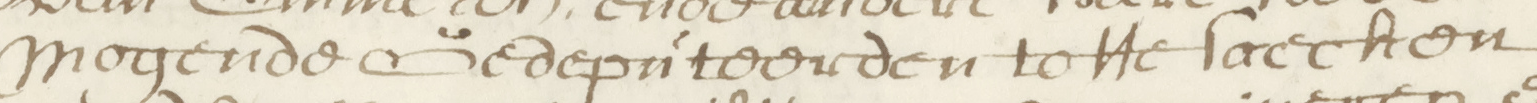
mogende Gedeputeerden totte saecken
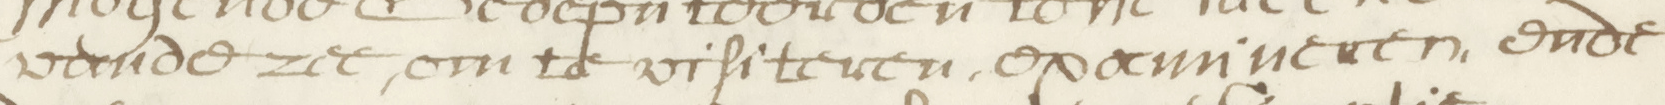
vande zee, om te visiteren, examineren, ende
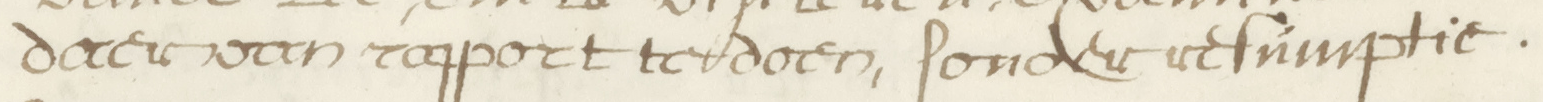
daer van rapport te doen, sonder resumptie.
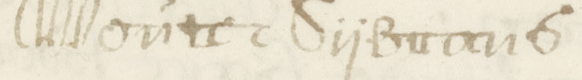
Wouter Sijbrans
